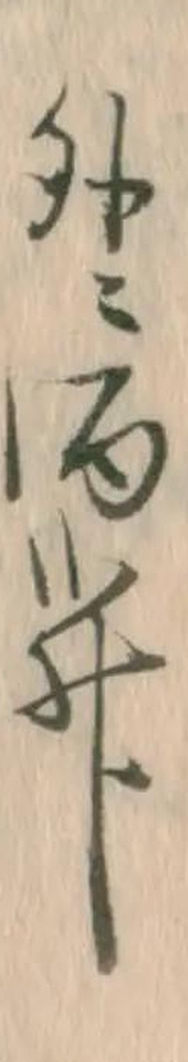外ニ酒弐升
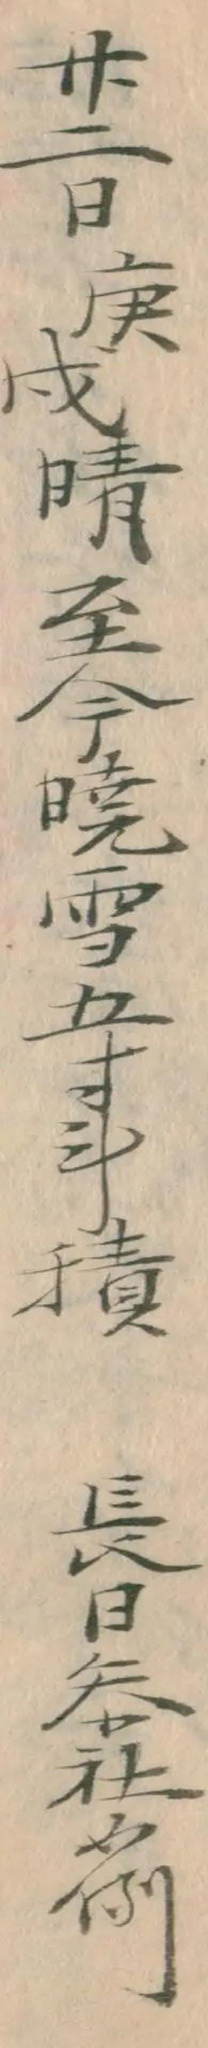廿二日庚戌晴至今暁雪五寸斗積長日参社如例

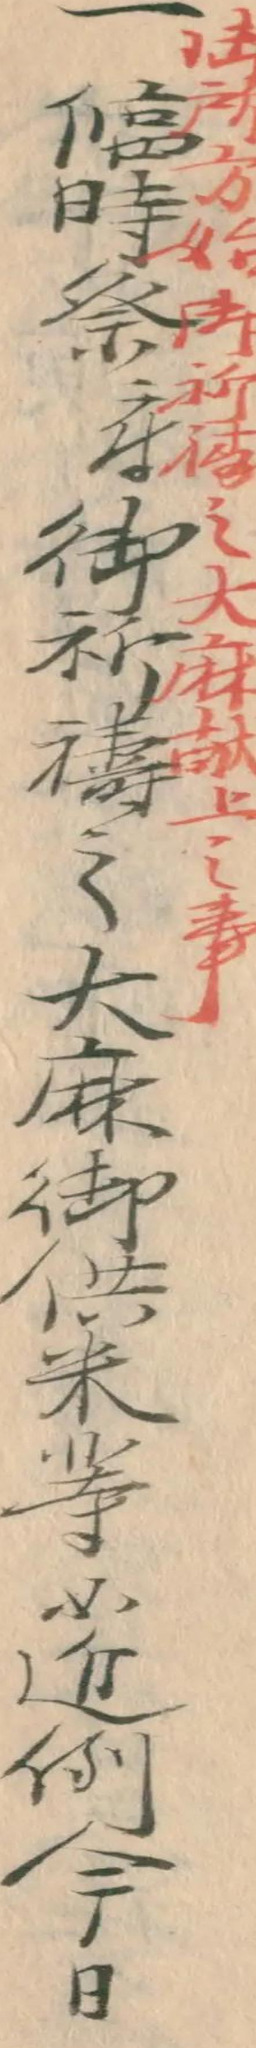一臨時祭ニ付御祈祷之大麻御供米等如近例今日
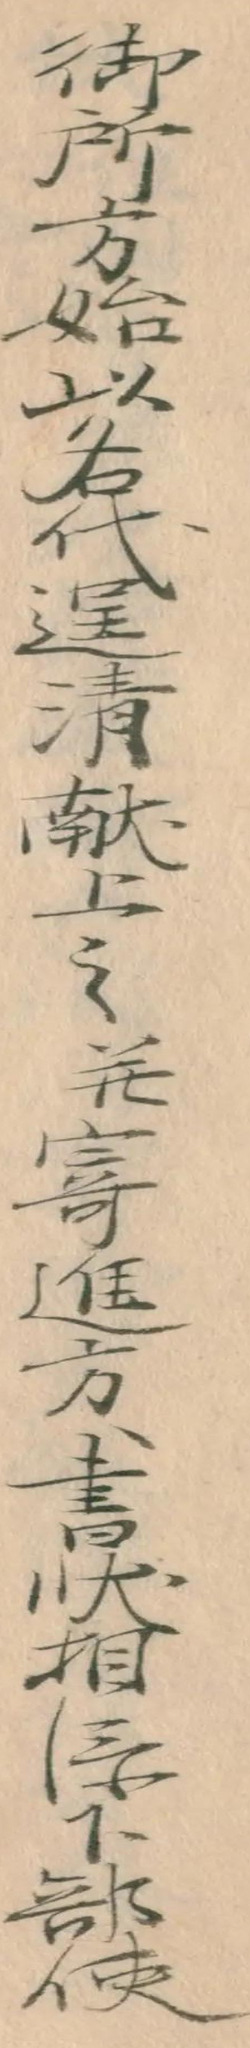御所方始以名代逞清献上之并寄進方ヘ書状相添下部使
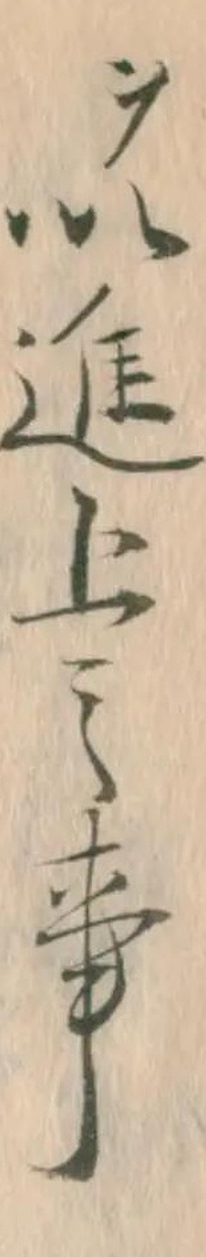ヲ以進上之事
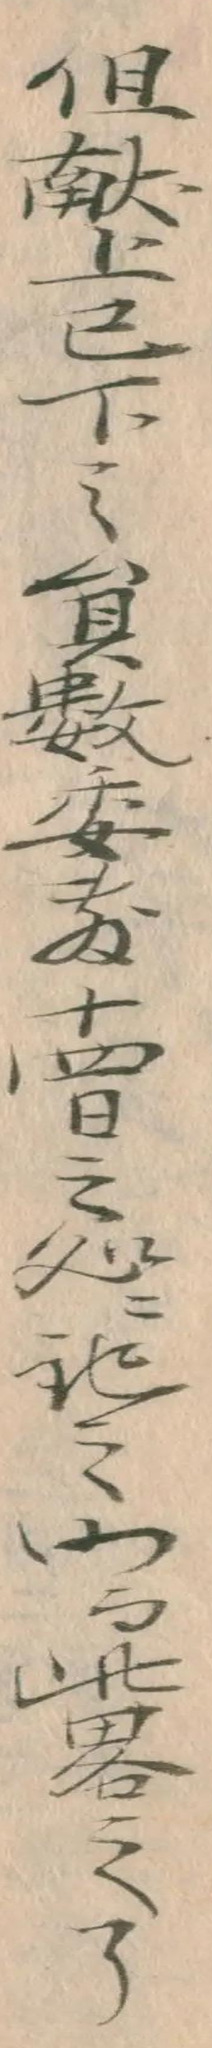但献上已下之員数委敷十四日之処ニ記之仍而此畧之了
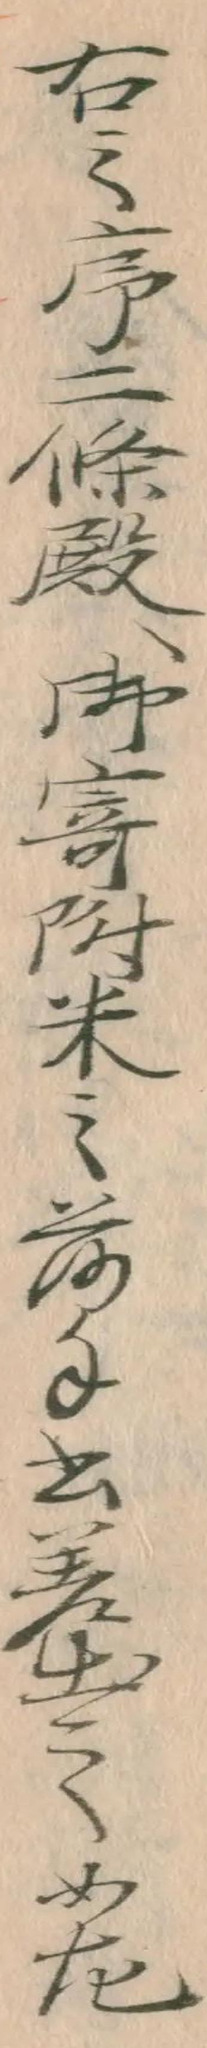右之序二條殿へ御寄附米之落手書差出之如左
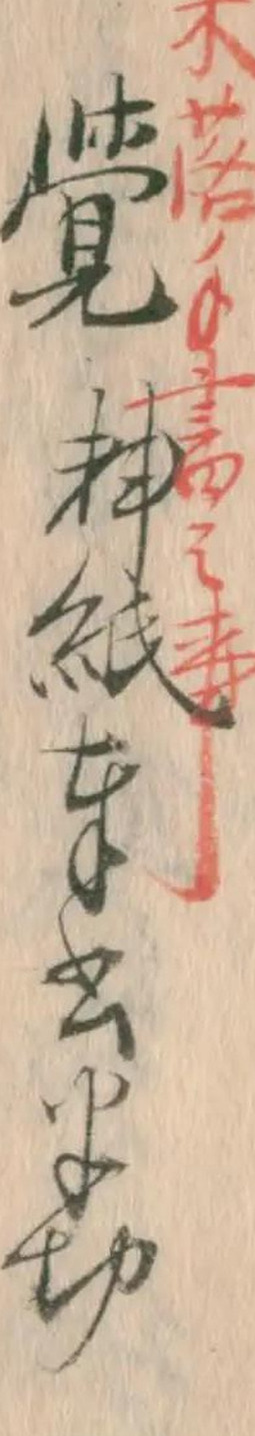覚科紙奉書半切
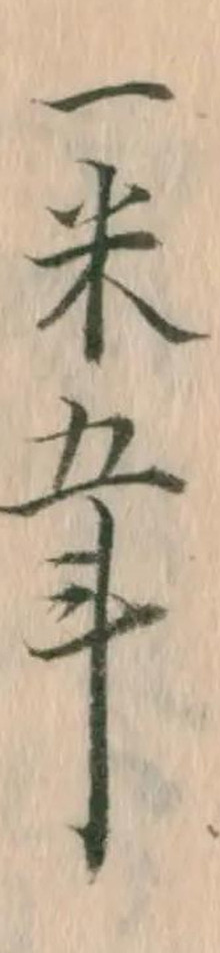一米五斗
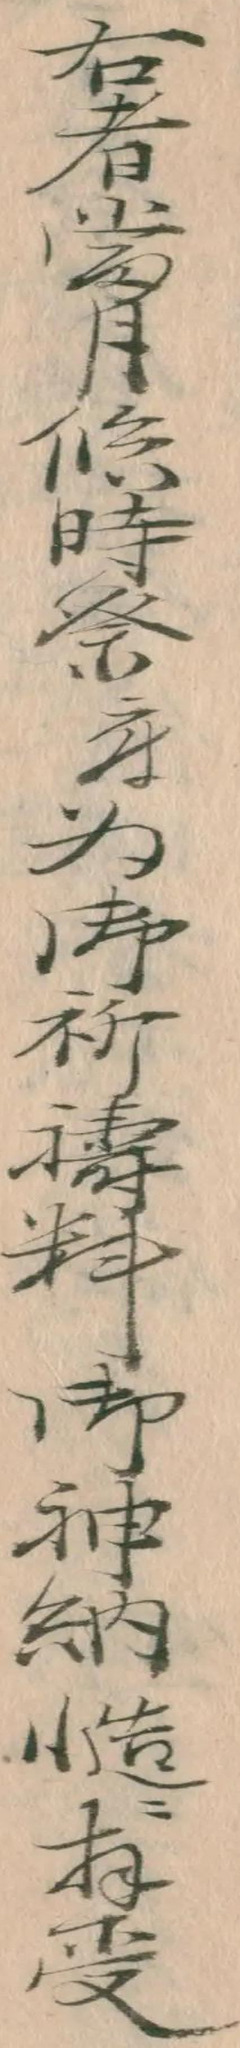右者當月臨時祭ニ付為御祈祷料御神納慥ニ拝受
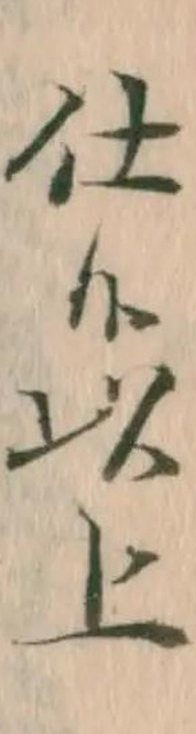仕候以上
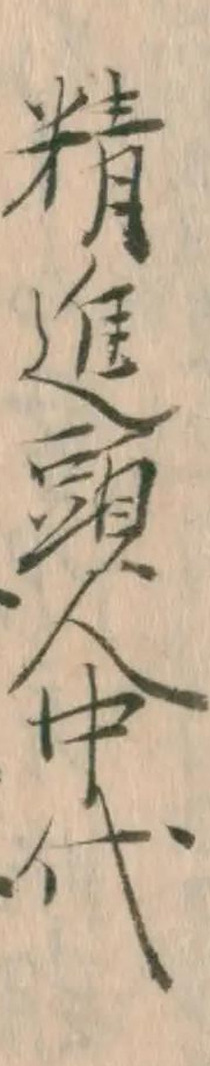精進頭人中代
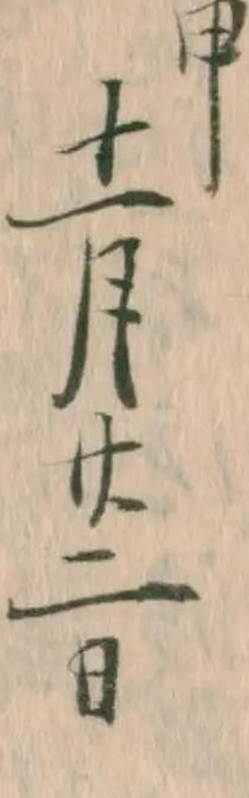申十一月廿二日
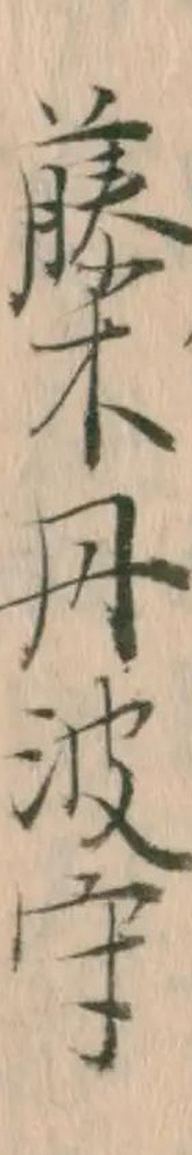藤木丹波守
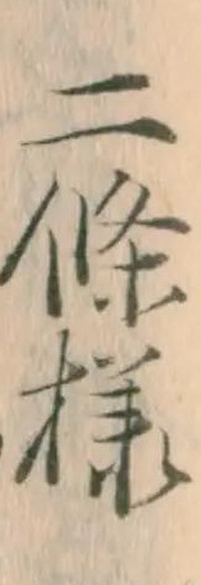二條様
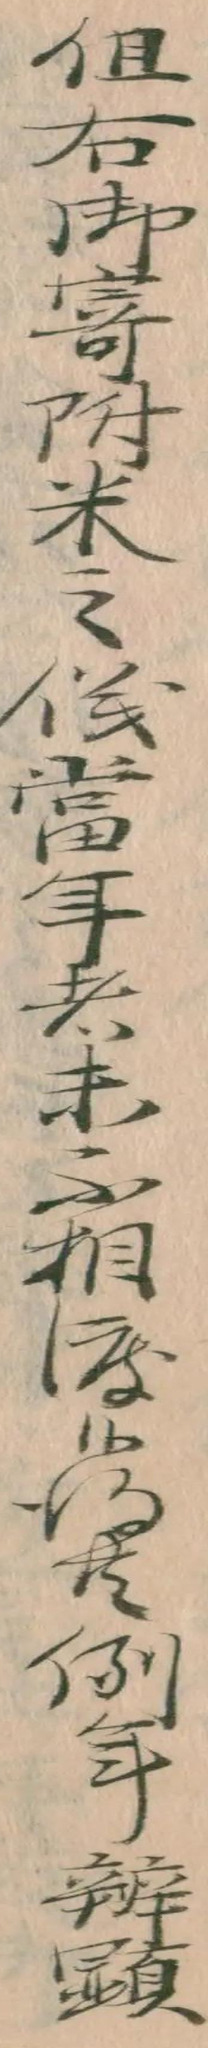但右御寄附米之儀當年者未不相渡候得共例年辨顕
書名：賀茂社記録. 第74冊
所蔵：国立国会図書館 National Diet Library, JAPAN
